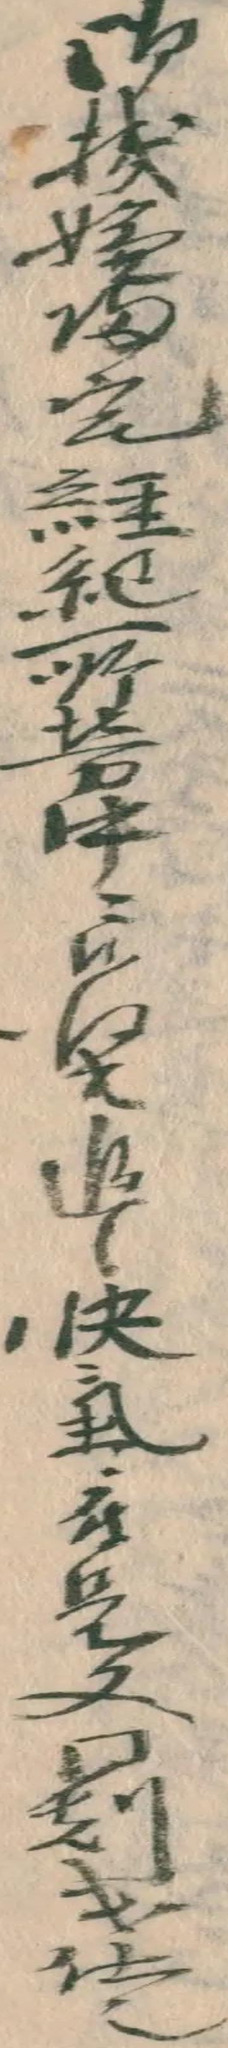御機嫌帰宅経紀所労中ニ候得共追々快氣ニ付是又同刻出仕也
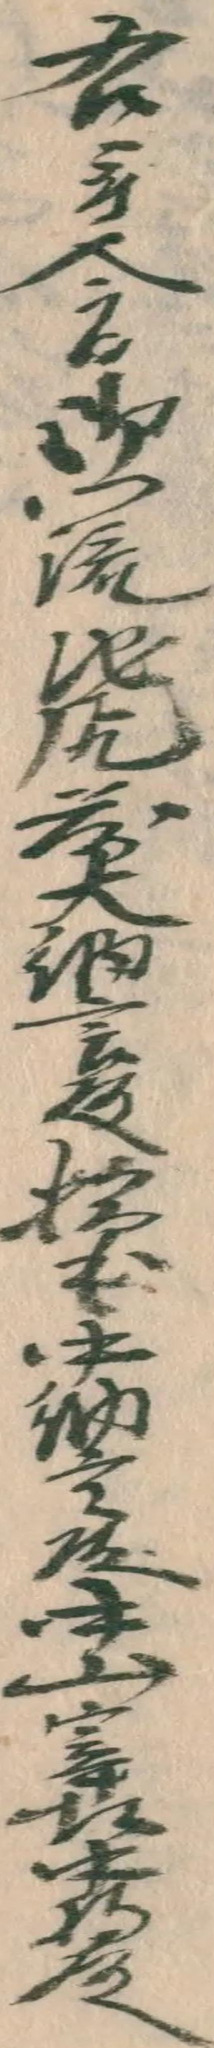右二付今日御門流池尻藤大納言殿橋本中納言丸中山宰相中将殿
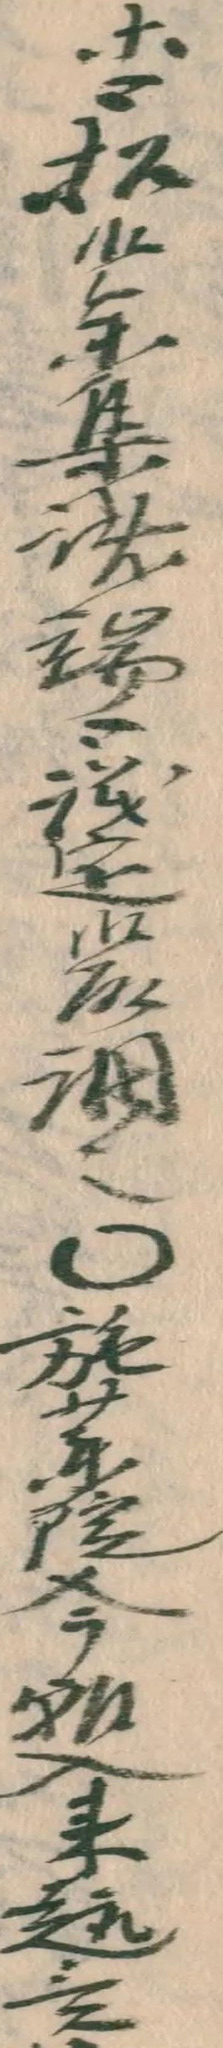等御招御参集諸端御議定御取調也〇施薬院入来趣意ハ
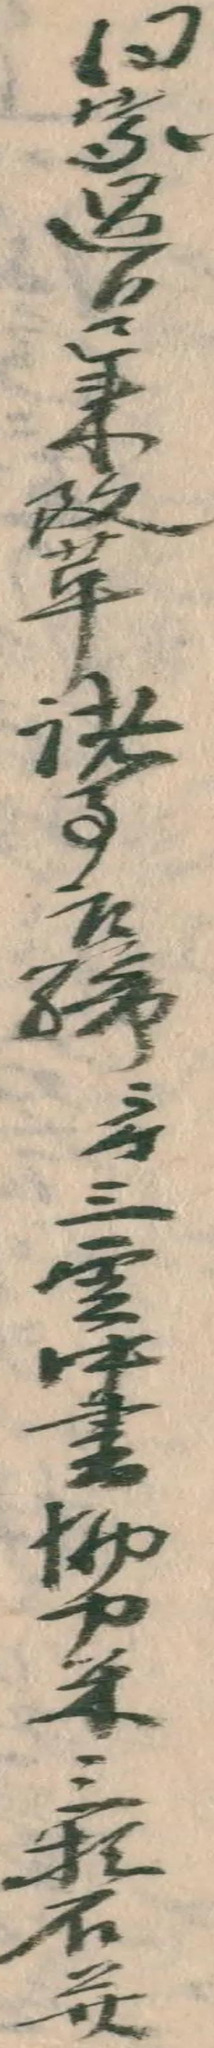同家過日已来改革諸事取締ニ付三雲中書協力米三拾石幷
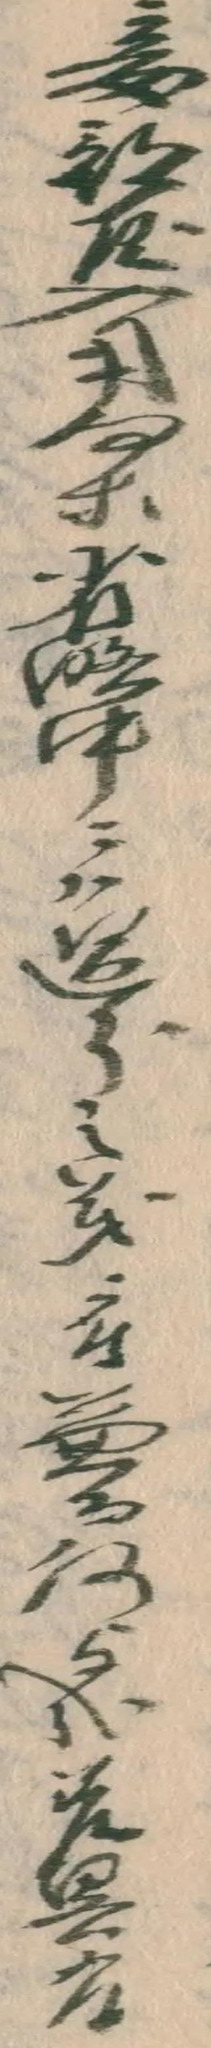妾部屋入用向等省略中二ハ過分之義二付兼而何分哉差異有
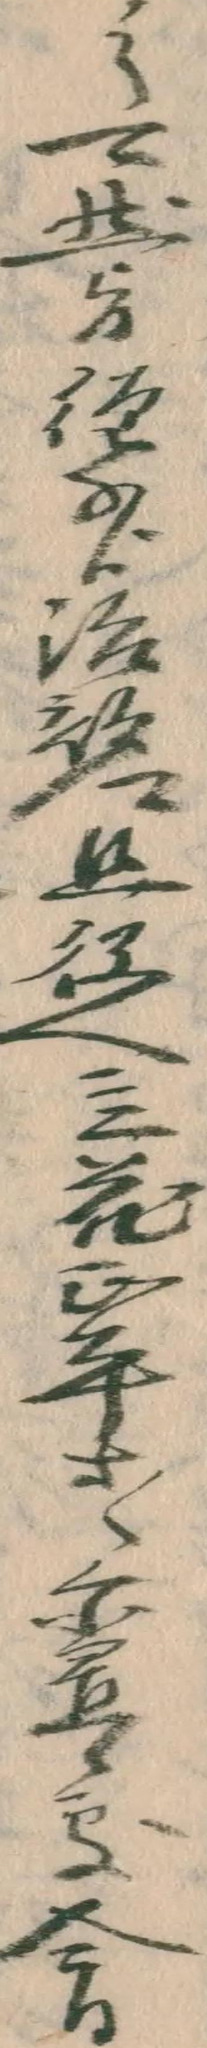之可然旨経千ゟ治替郷且役人立花正平等へ示置候處今日
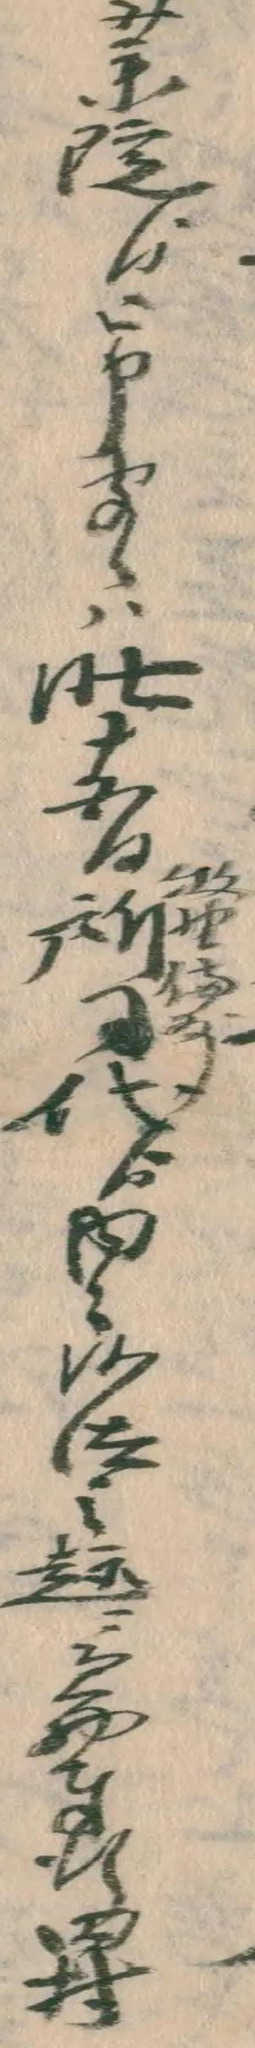薬院ゟ被申聞候ハ昨十五日所司代牧野備前ゟ内々沙汰之趣ニ而筋奉行田村
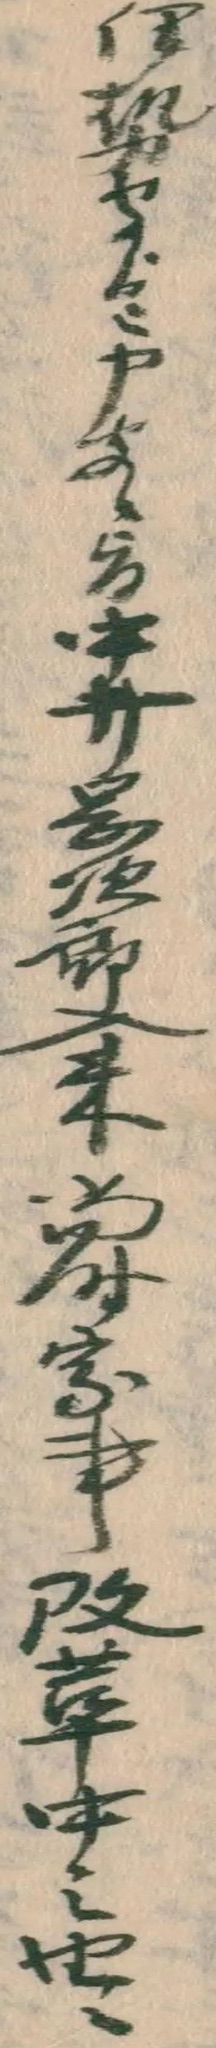伊勢守ゟ被申聞候旨中井岡次郎入来當時家事改革中之由ニ
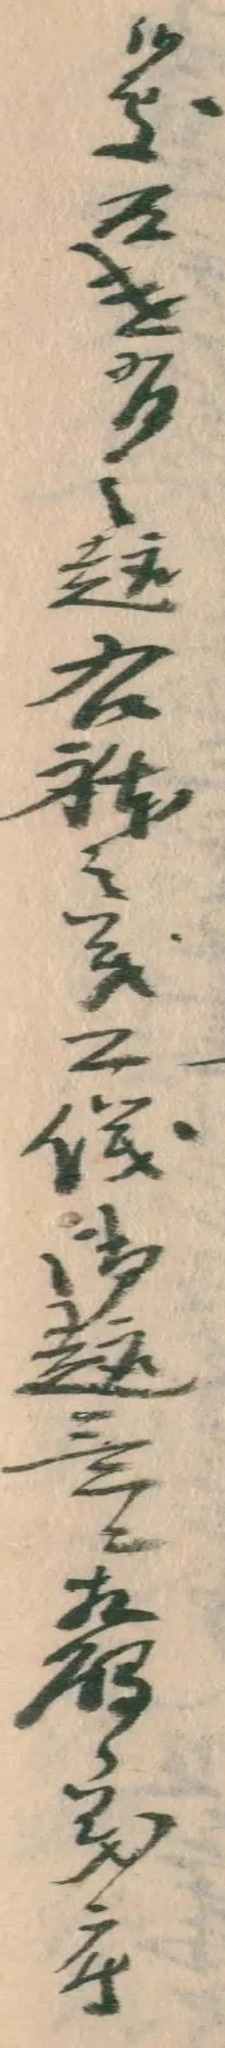候處召遣有之趣右躰之義公儀御趣意に相觸候義ニ付
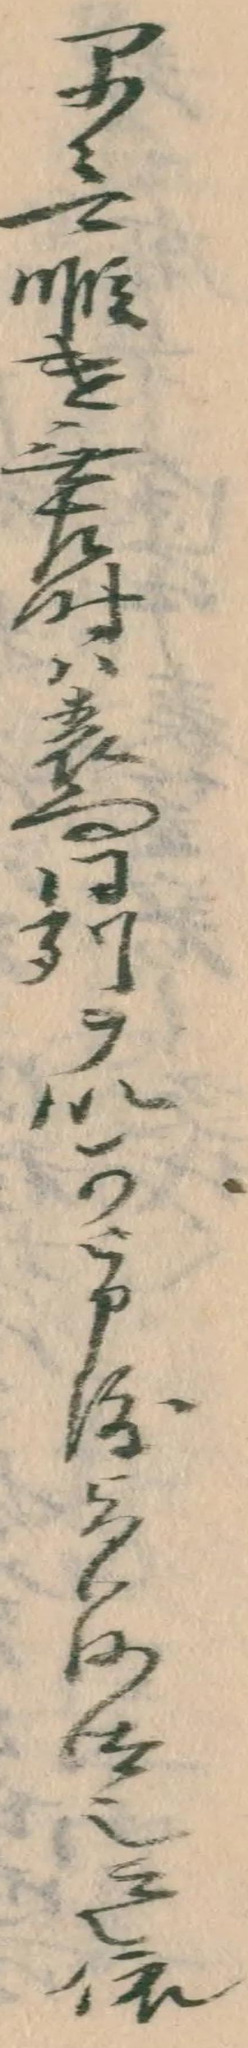早々可暇遣無左時ハ表向同列を以可被申渡旨御沙汰也云々依
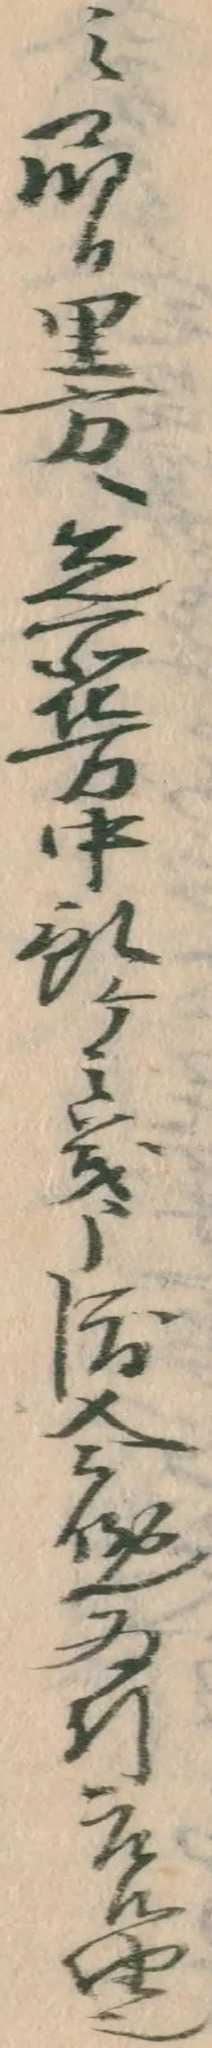之即日里方へ先所仕万中預ケ之義申渡今晩為引取候由也
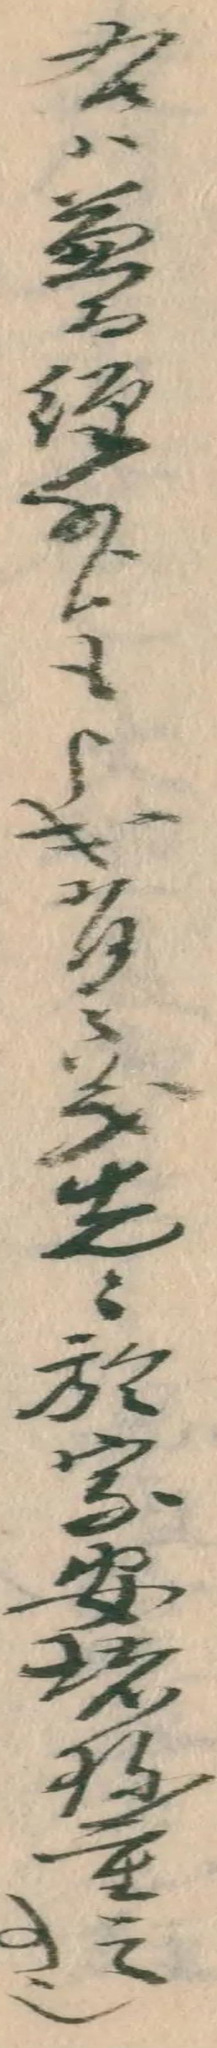右ハ兼而経千ゟも申出有之義先々於家安堵珍重之事也
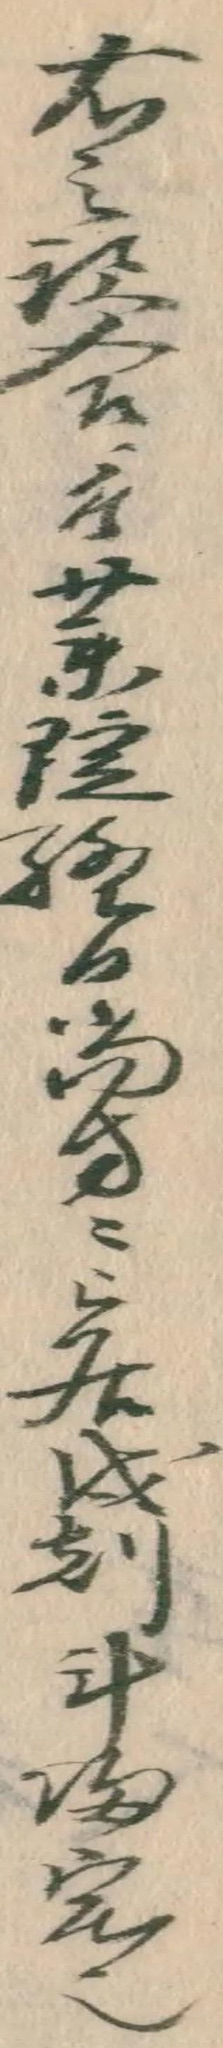右之訳合ニ付薬院終日當方ニ被居戌刻斗帰宅也
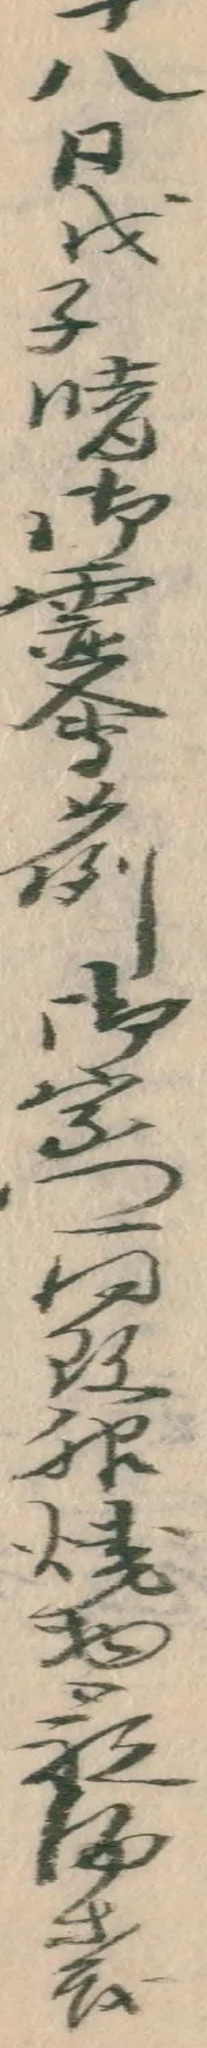十八日戊子晴御霊會如例御家門一同改服焼物御祝酒等も
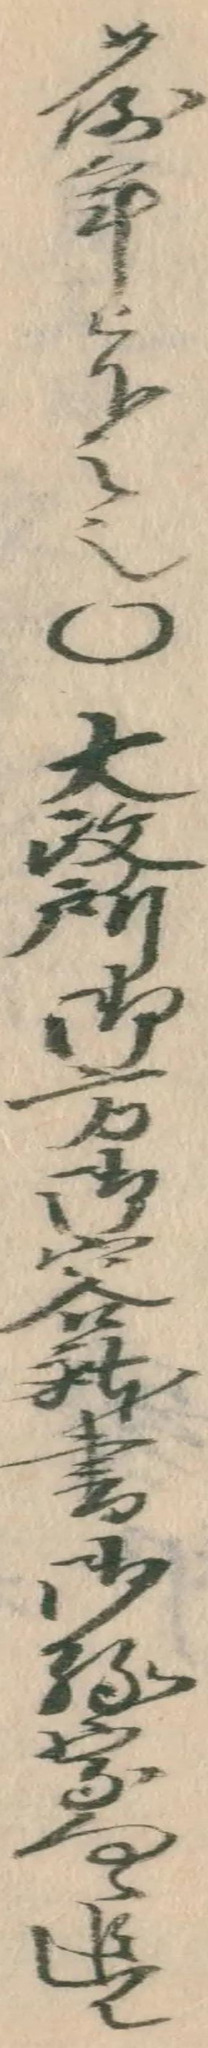如例年被下之也○大政所御方御容躰書御縁向へ追々
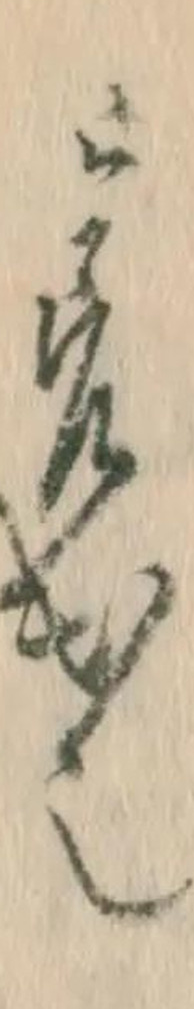ニ差出也
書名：賀茂社記録. 第69冊
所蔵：国立国会図書館 National Diet Library, JAPAN
